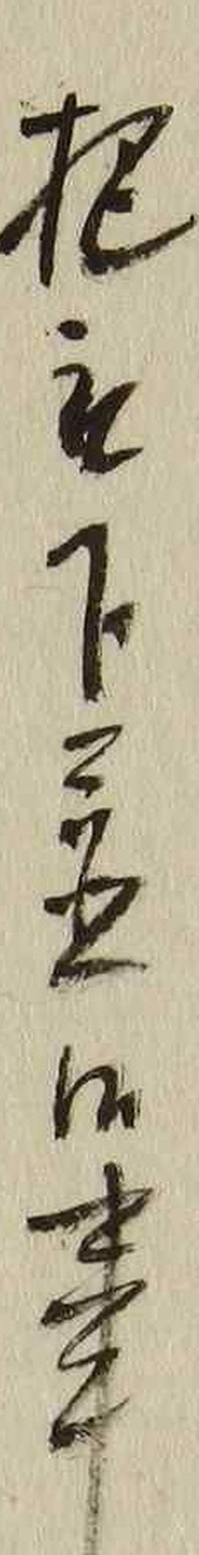把被下置候事
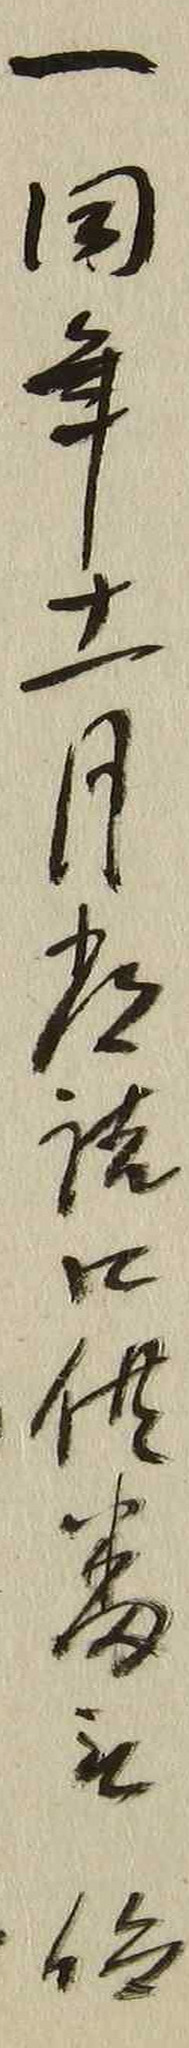一同年十一月常詰御供番被仰
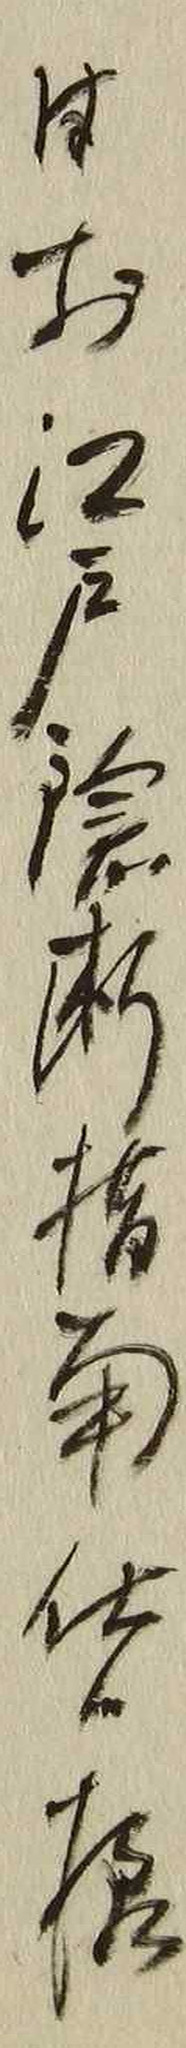付於江戸鎗術指南仕候様
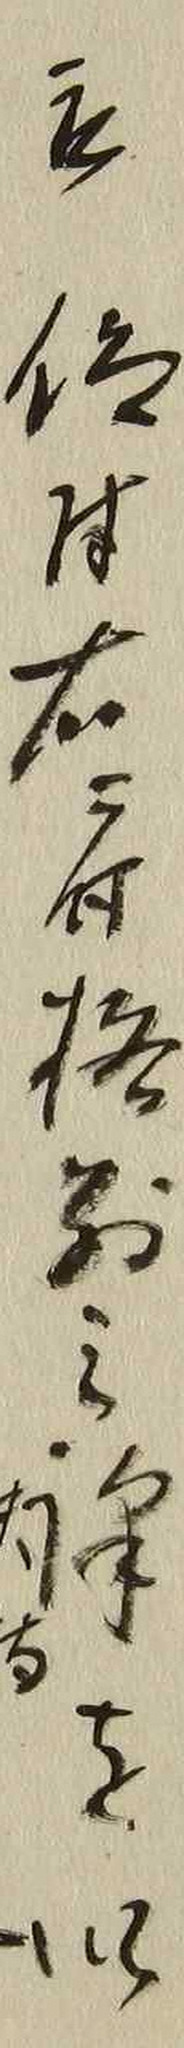被仰付右ニ付格別之訳を以
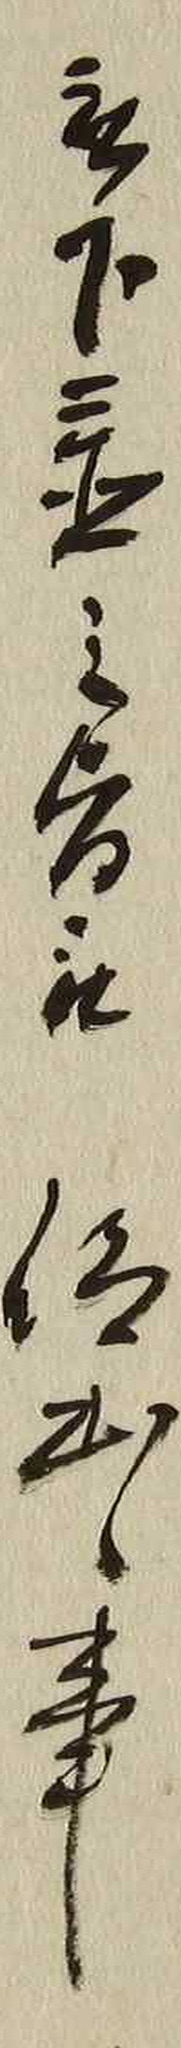被下置之旨被仰出候事
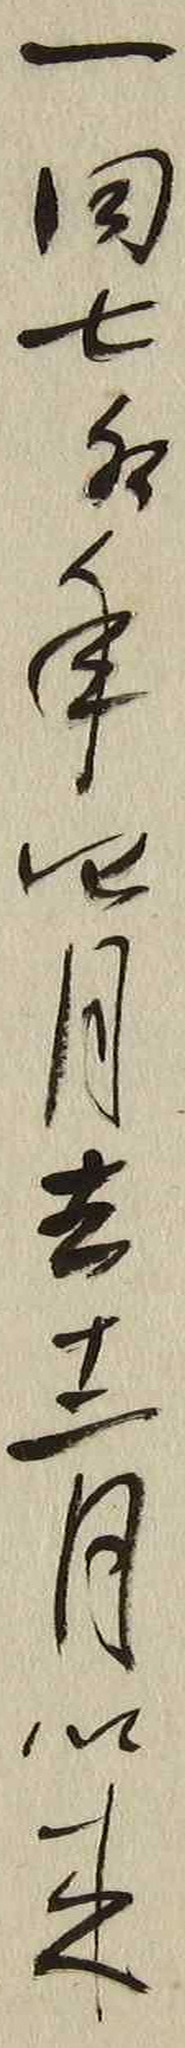一同七卯年四月去十二月以来
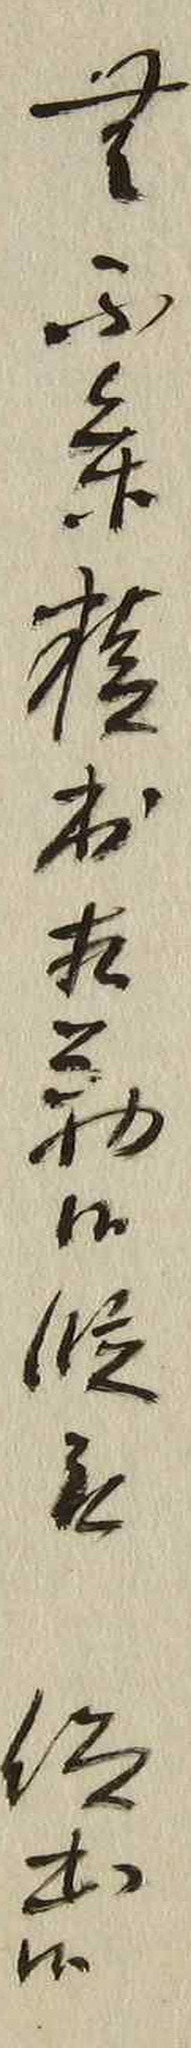無不参精出相勤候段被仰出候
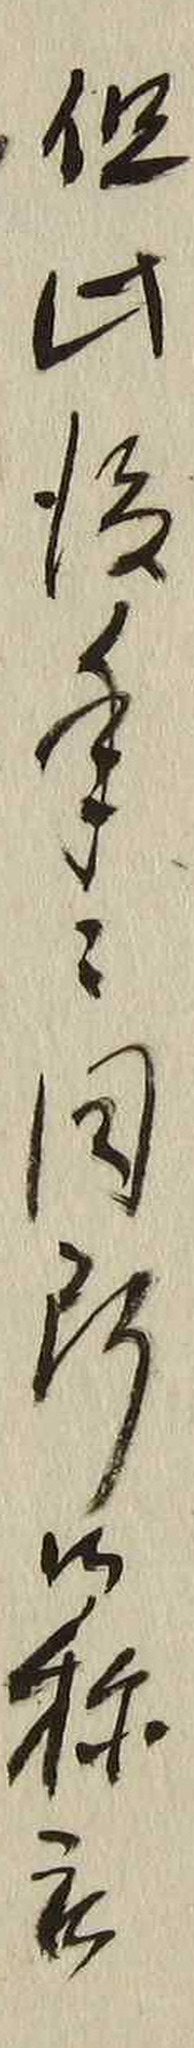但此後年々同断御称被
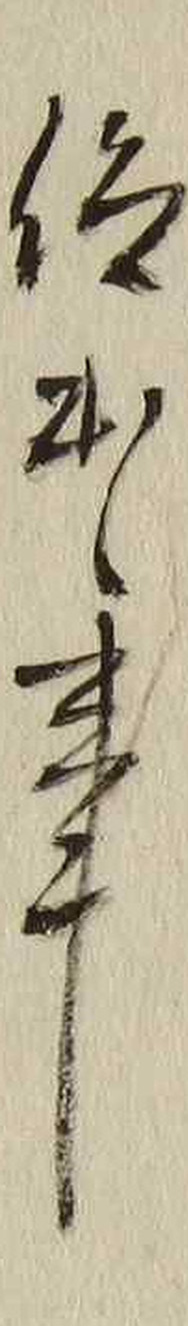仰出候事
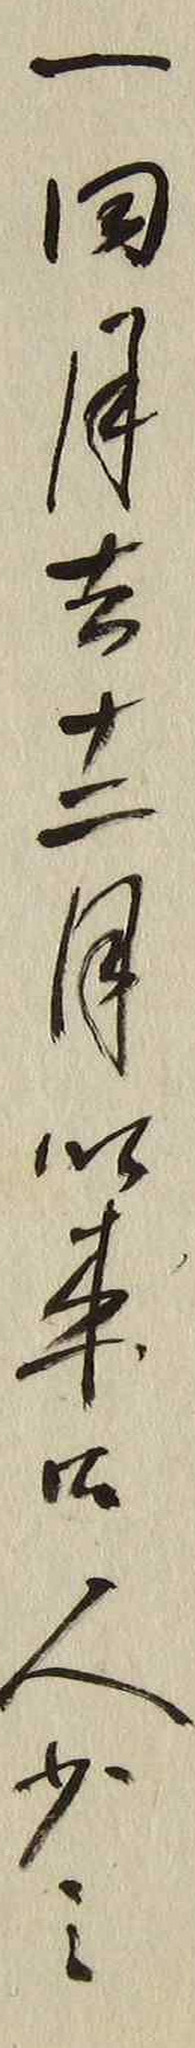一同月去十二月以来御人少之
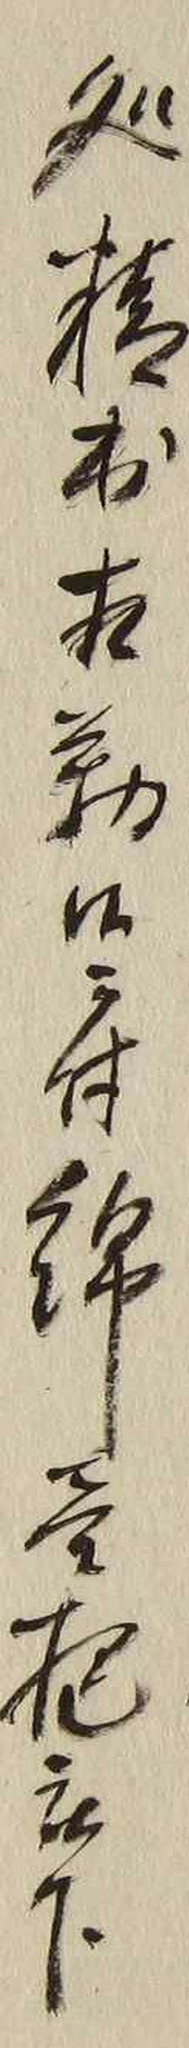処精出相勤候ニ付綿壱把被下
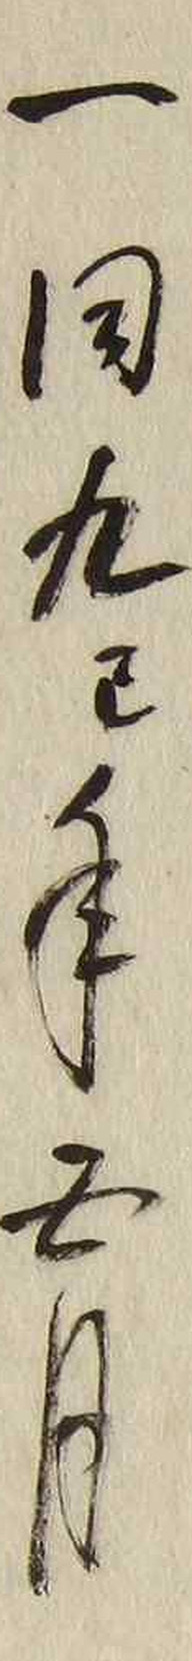一同九巳年五月
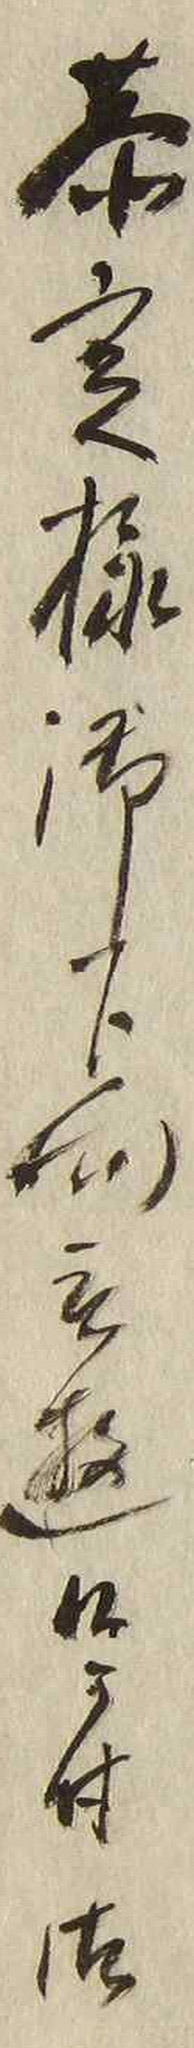恭定様御下向被遊候ニ付御

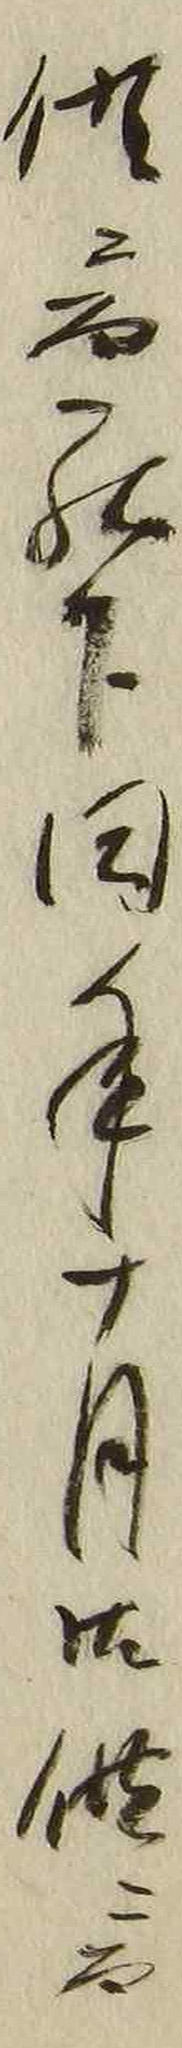供ニ而罷下同年十月御供ニ而
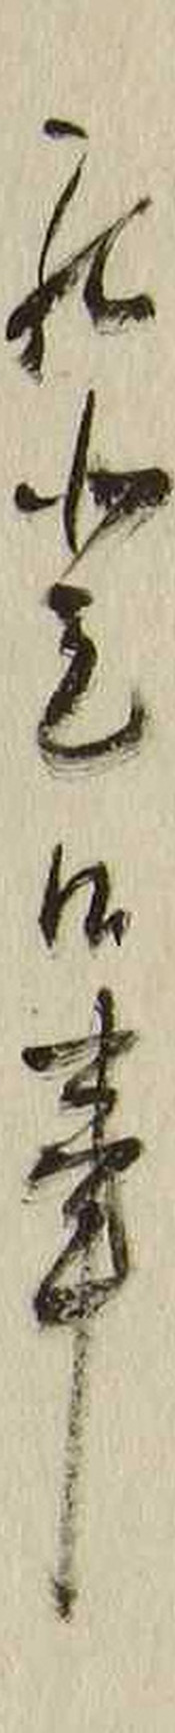罷登候事
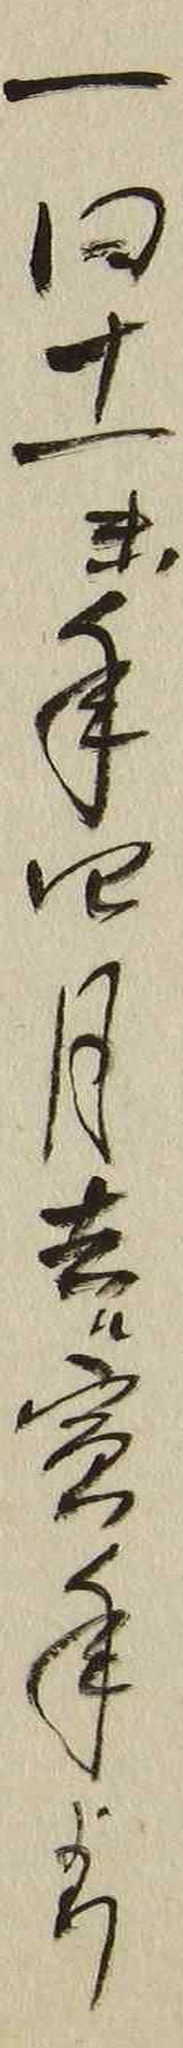一同十一未年四月去ル寅年より
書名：諸士系譜　巻之359　す之部9
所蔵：会津若松市立会津図書館
